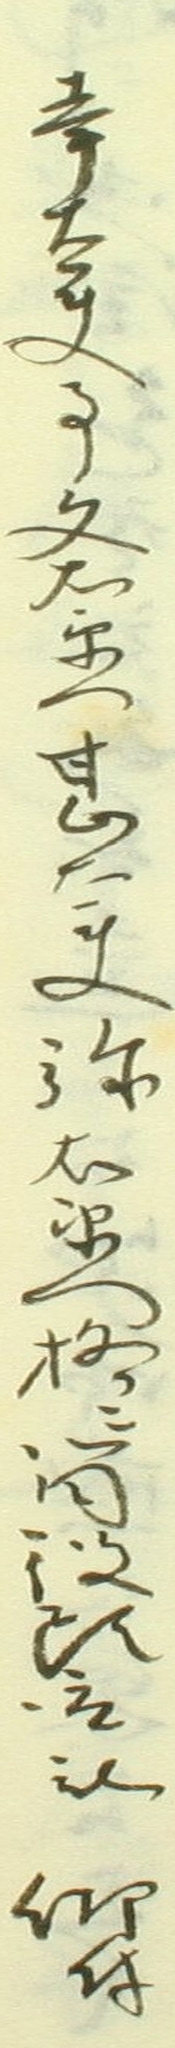幸太夫事文右衛門甚太夫弥右衛門格に筒役頭立被仰付
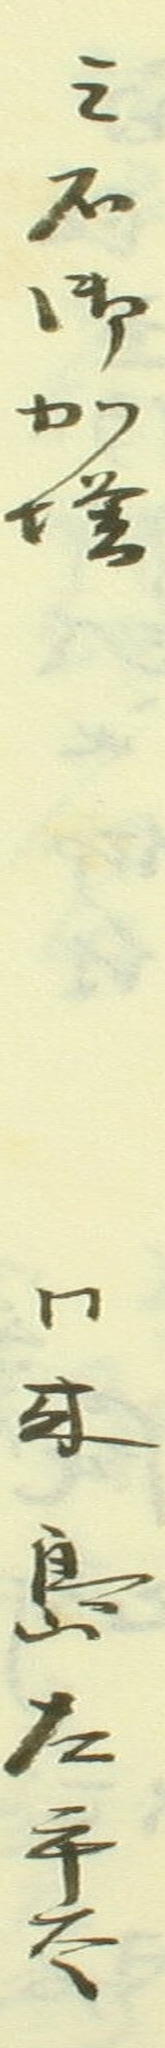三石御加増同来島左平太
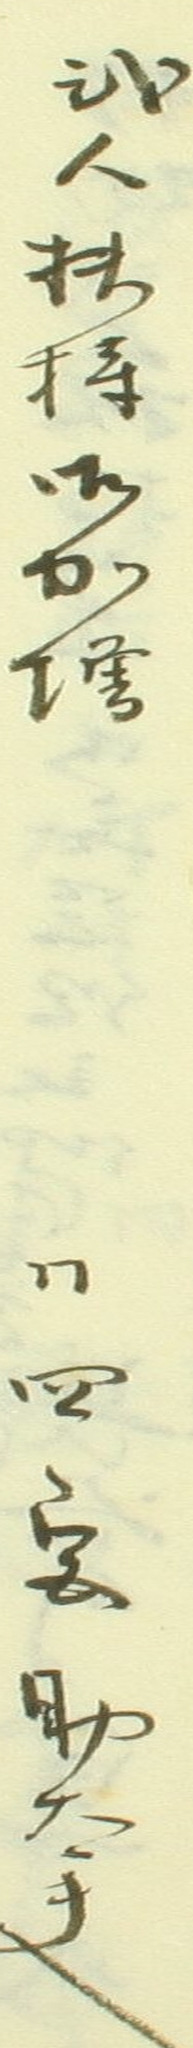弐人扶持御加増同四宮助太夫
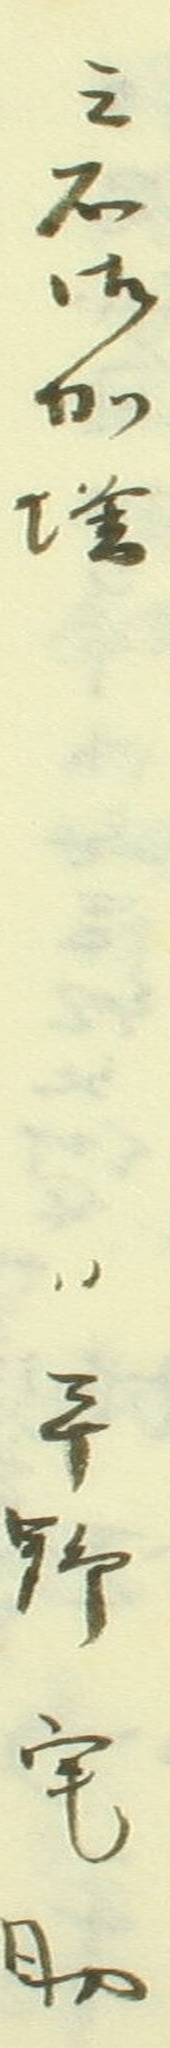三石御加増同平野宅助
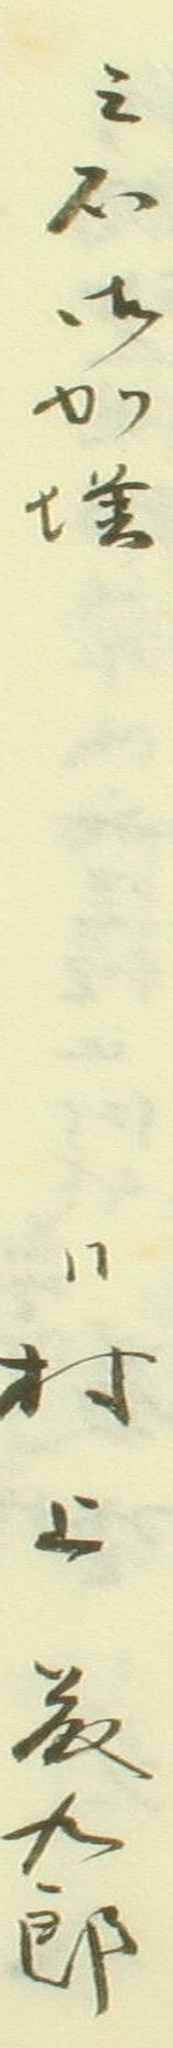三石御加増同村上籐九郎
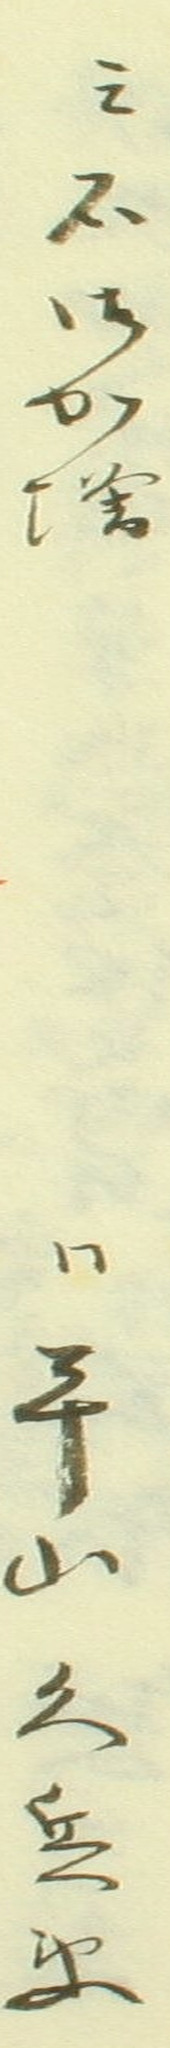三石御加増同平山久兵衛
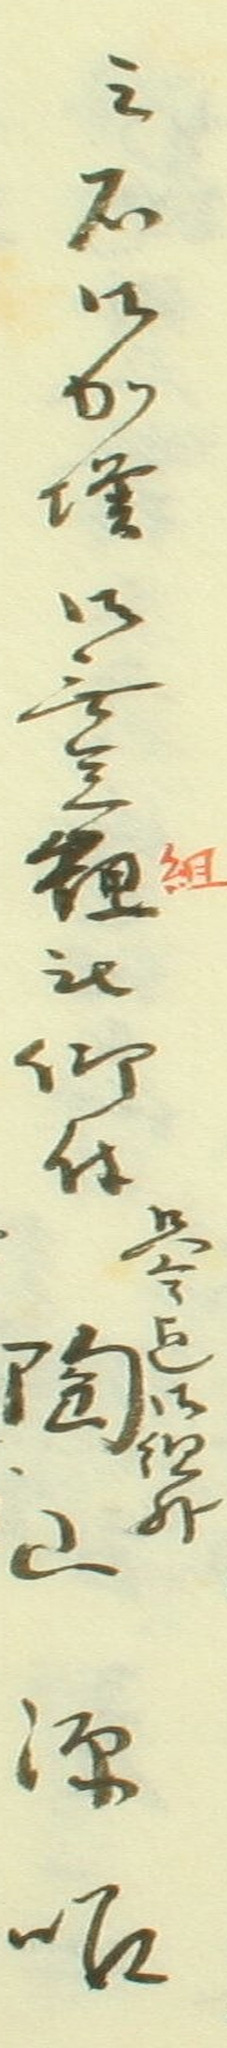三石御加増御無足組被仰付同
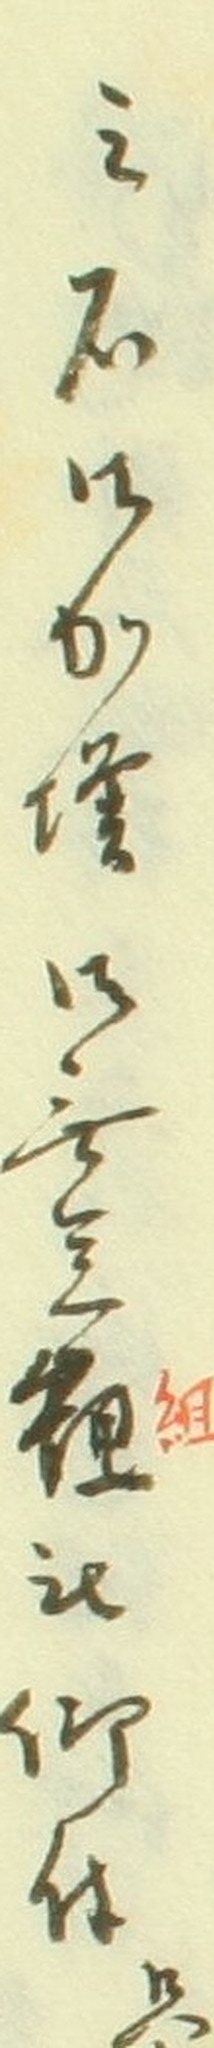三石御加増御無足組被仰付同
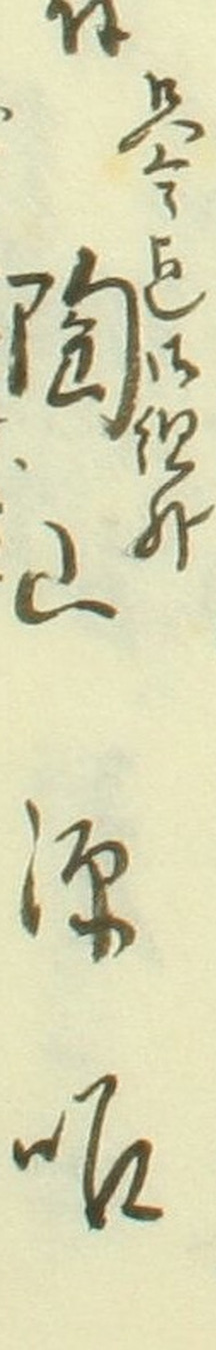陶山源作
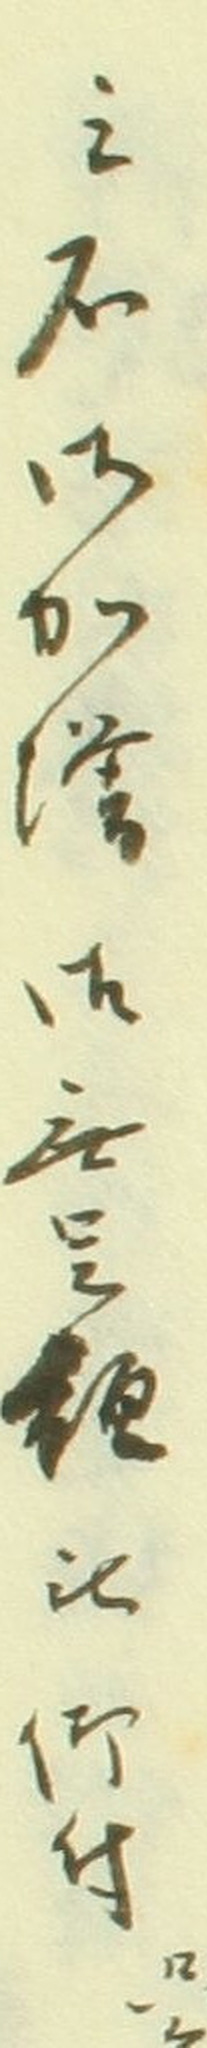三石御加増御無足組被仰付同
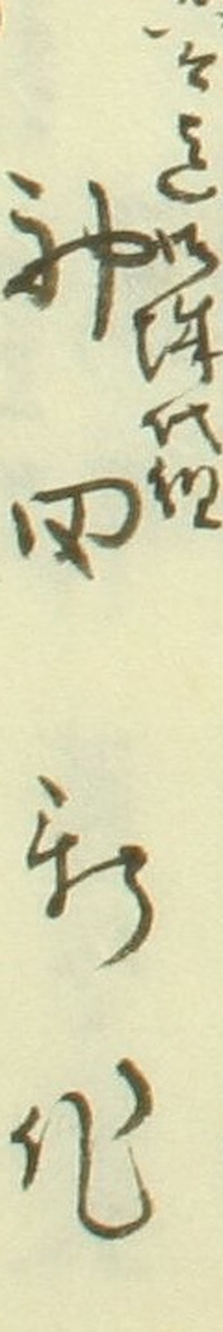神田新作
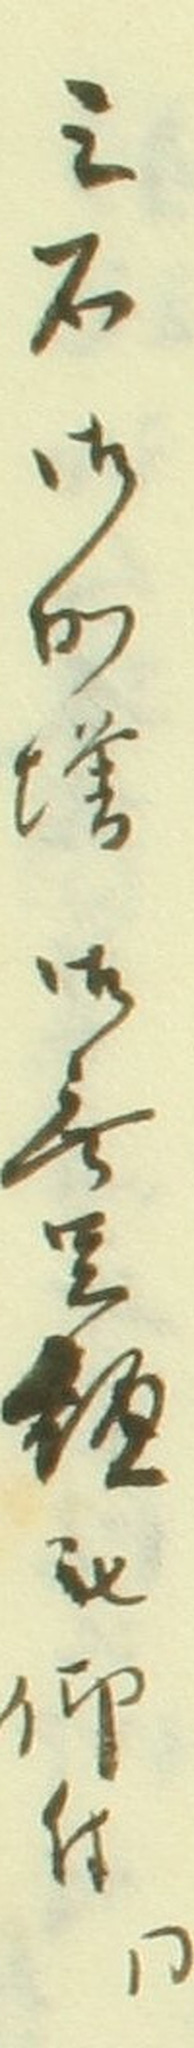三石御加増御無足組被仰付同
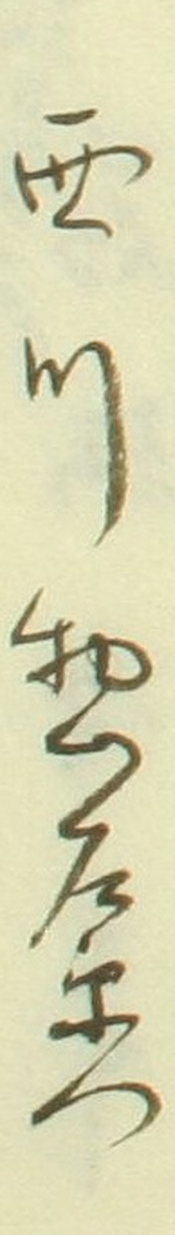西川惣左衛門
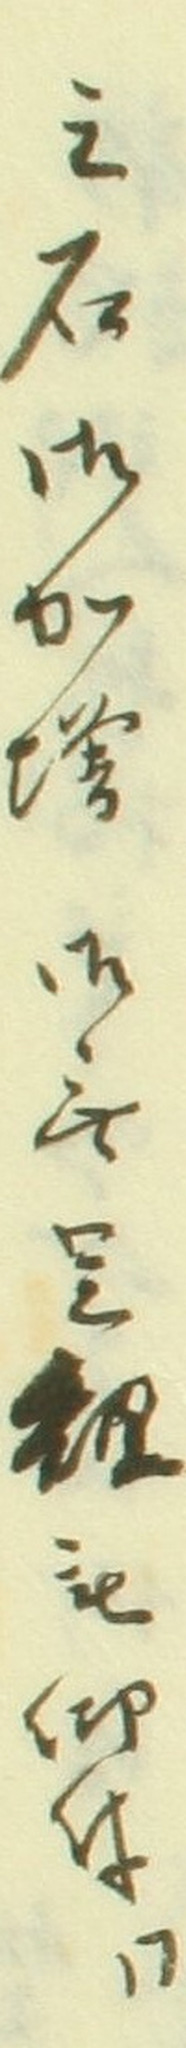三石御加増御無足組被仰付同
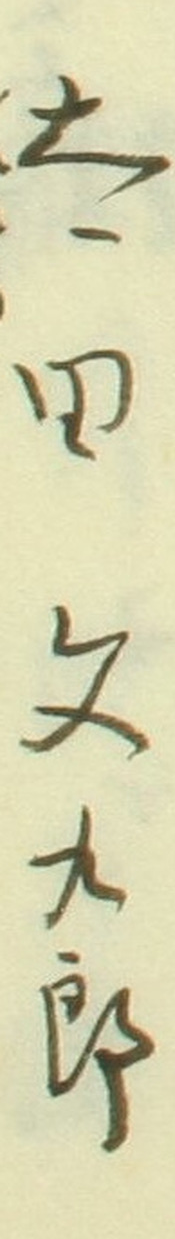太田文九郎
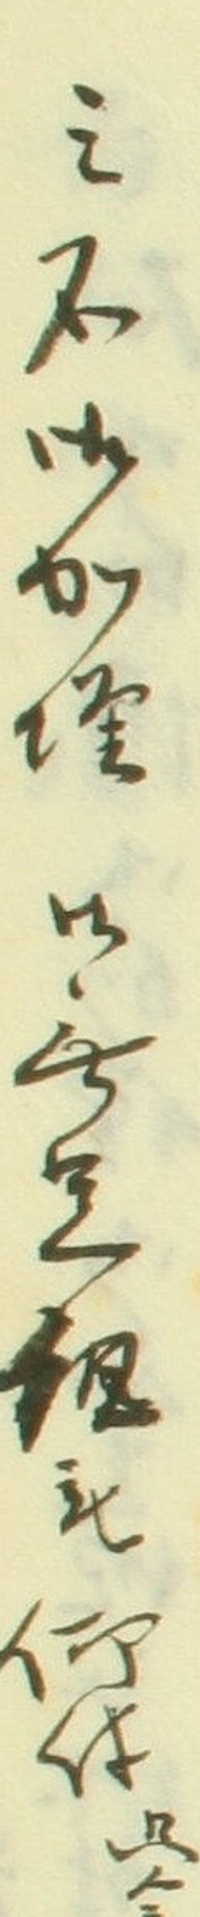三石御加増御無足組被仰付同
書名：唐船漂流記 三
